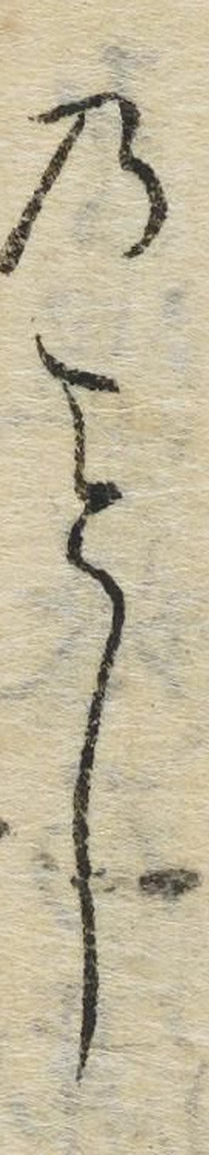のことし
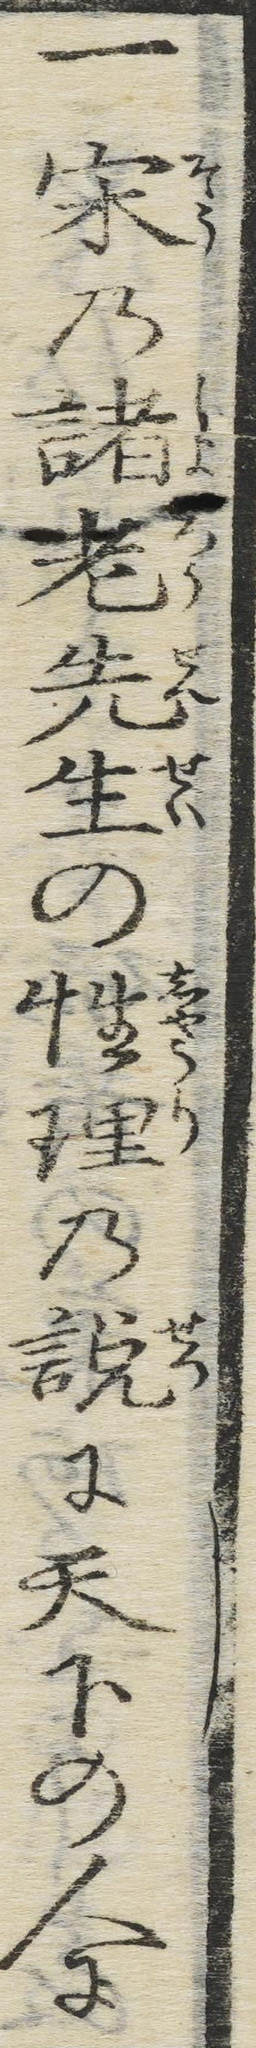一宋の諸老先生の性理の説に天下の人に
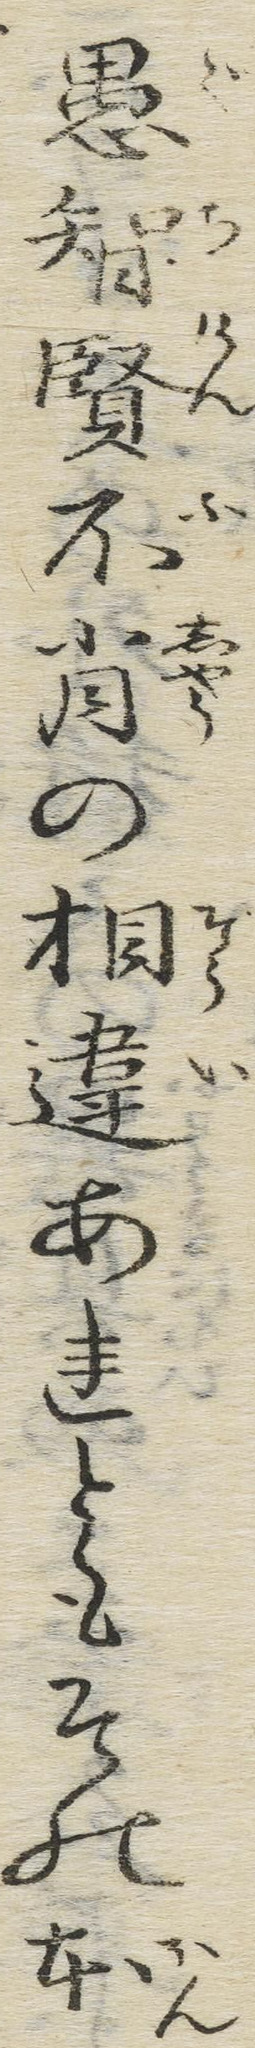愚痴賢不肖の相違あれともその本
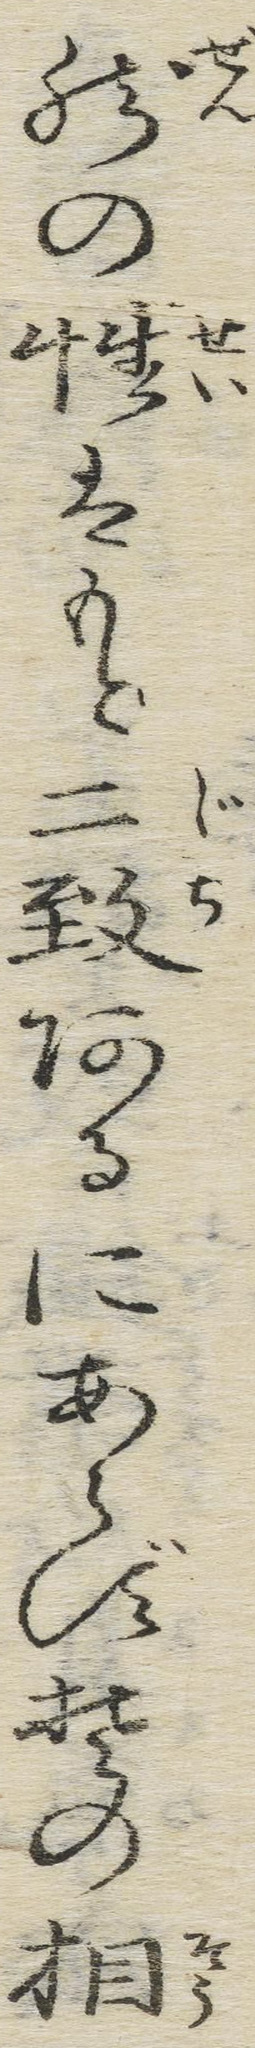然の性はもと二致あるにあらずその相
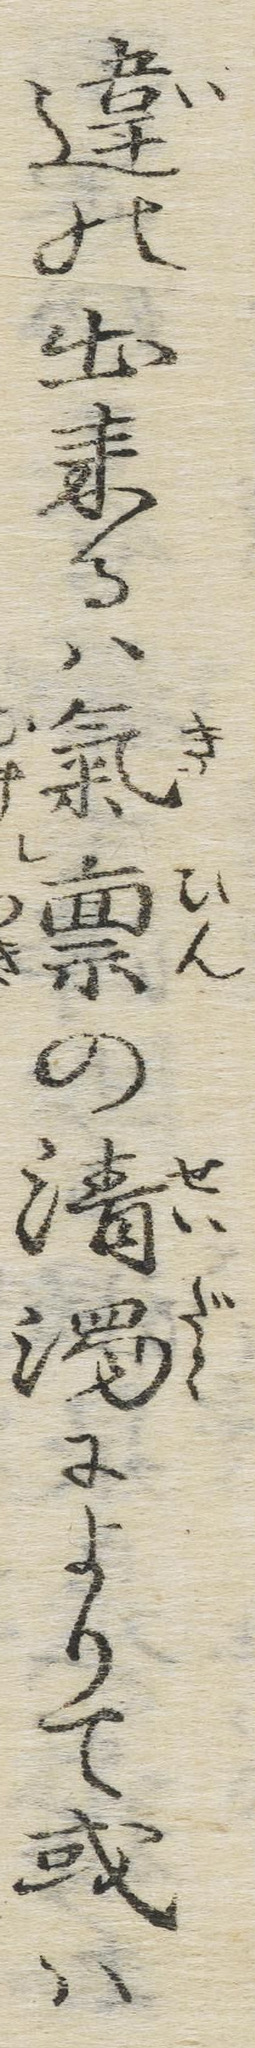違の出来るは気稟の清濁によりて或は
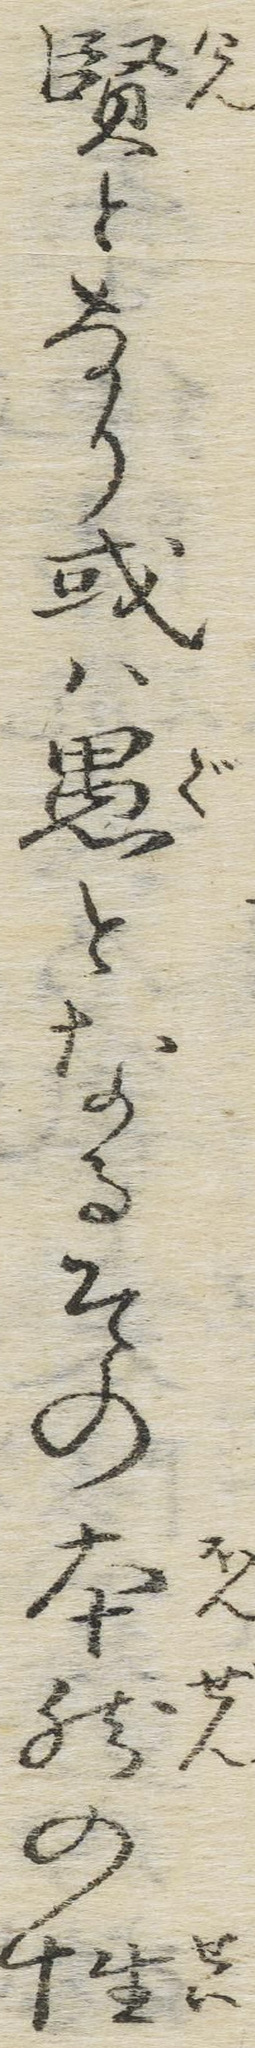賢となり或は愚となるその本然の性
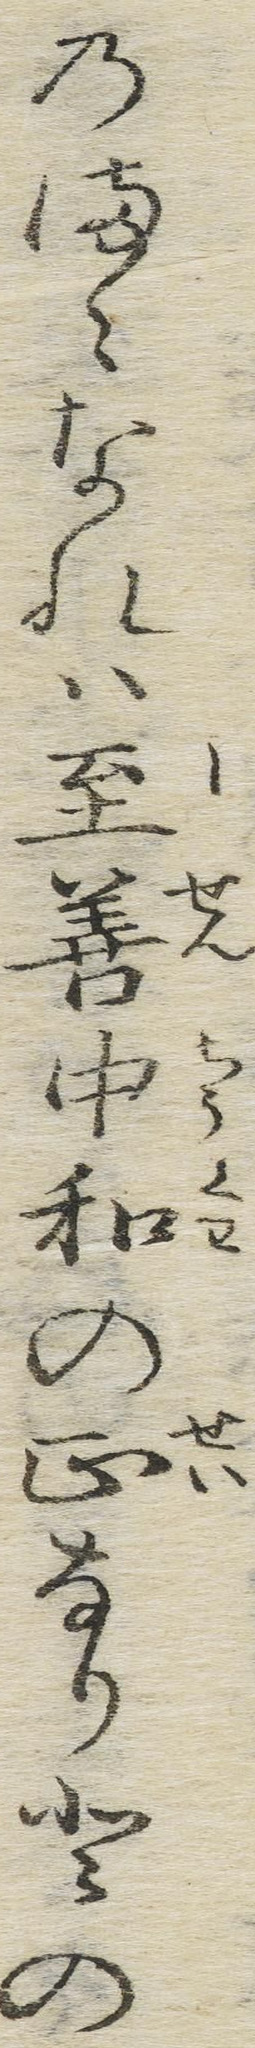のまゝなれは至善中和の正なりとの
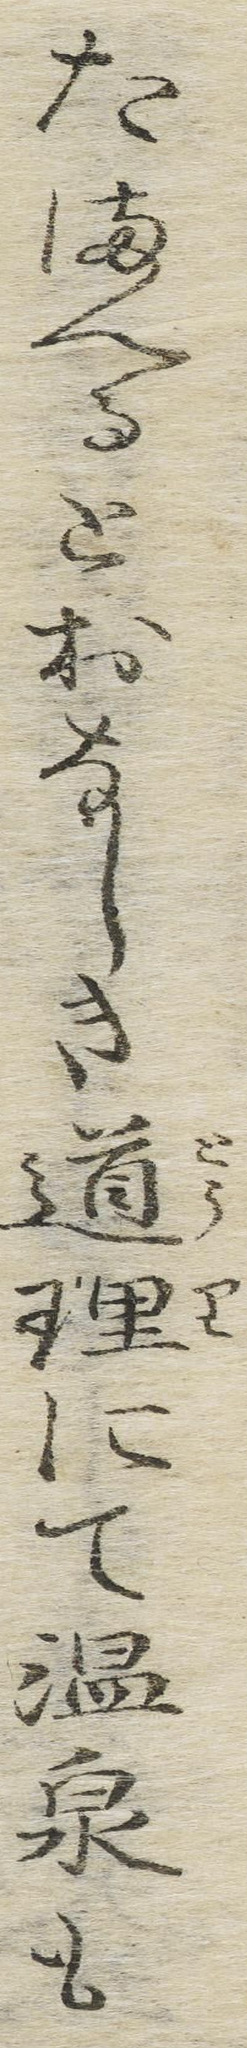たまへるとおなしき道理にて温泉も
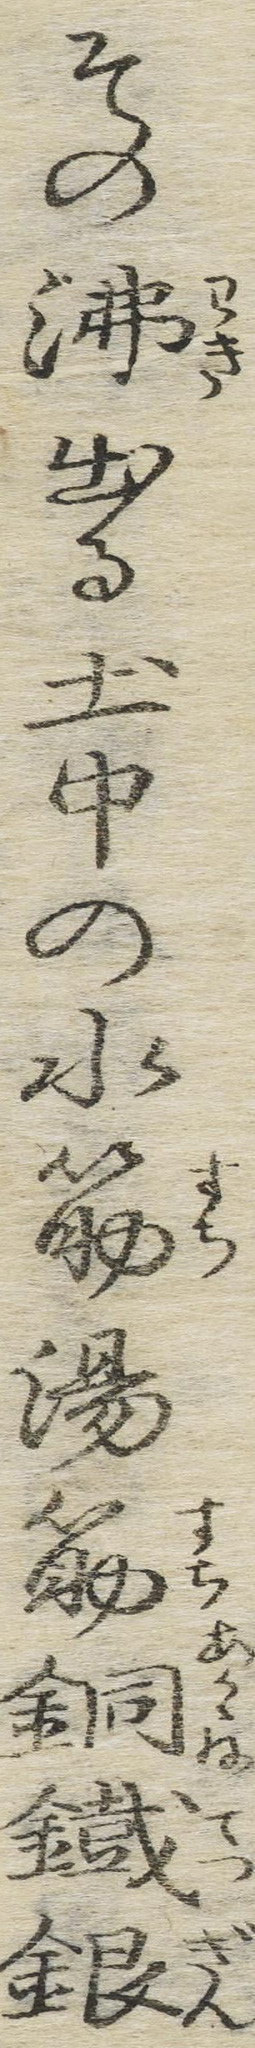その沸出る土中の水筋湯筋銅鉄銀

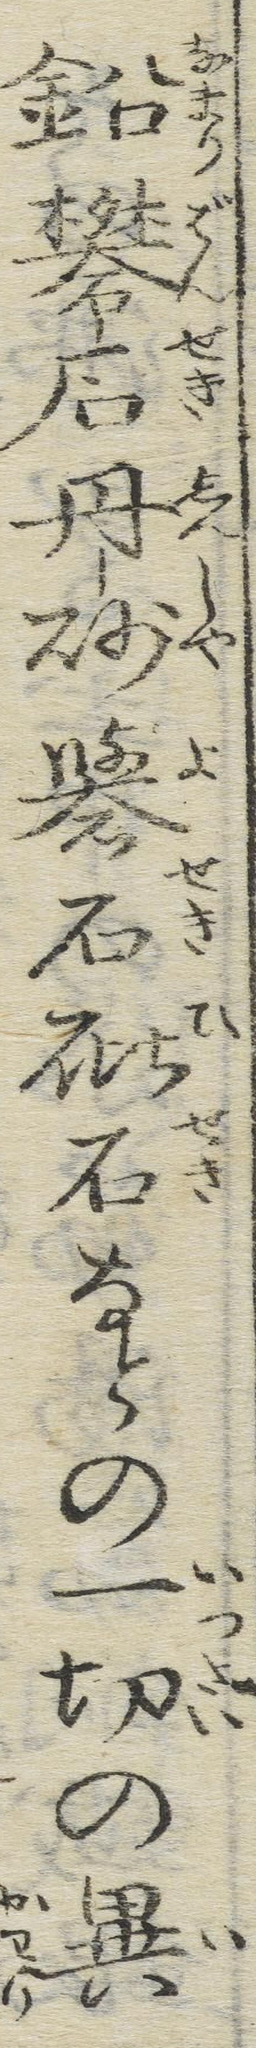鉛礬石丹砂礜石砒石などの一切の異
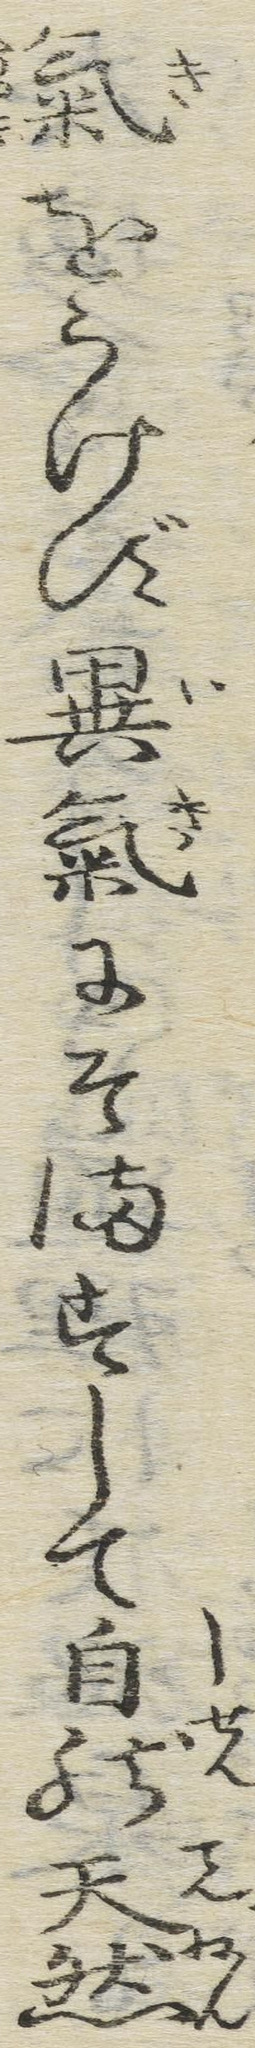気をうけず異気にそますして自然天然
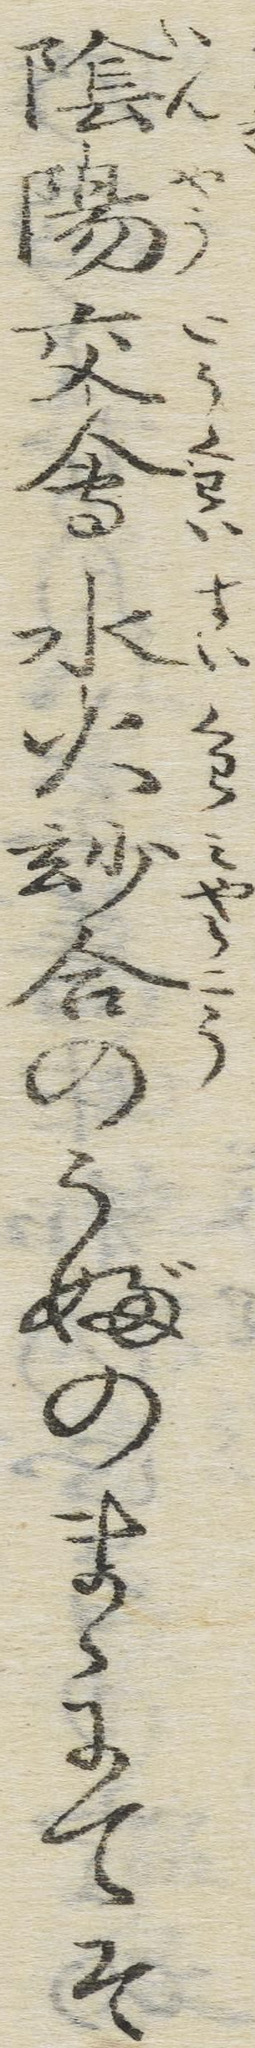陰陽交会水火妙合のうぶのまゝにてそ
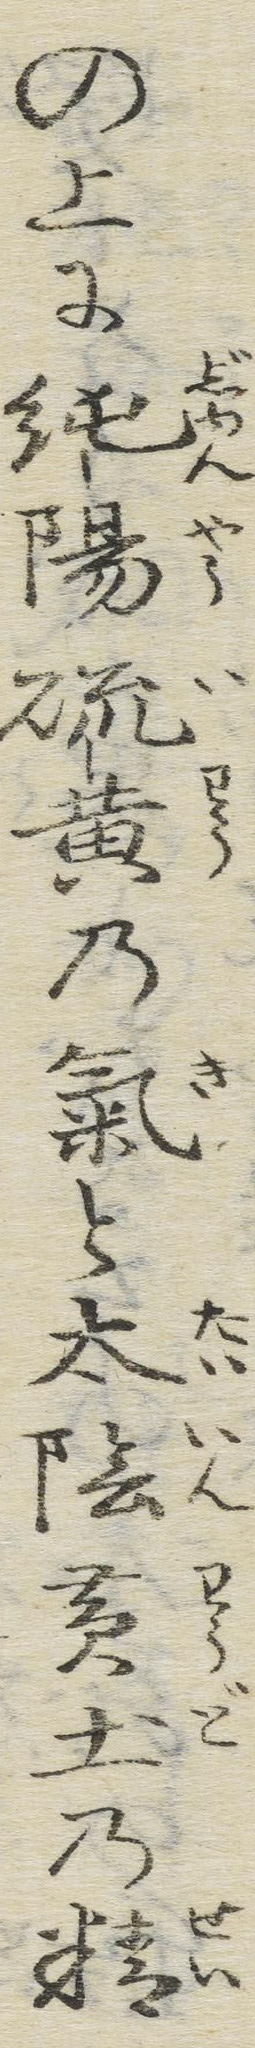の上に純陽硫黄の気と太陰黄土の精
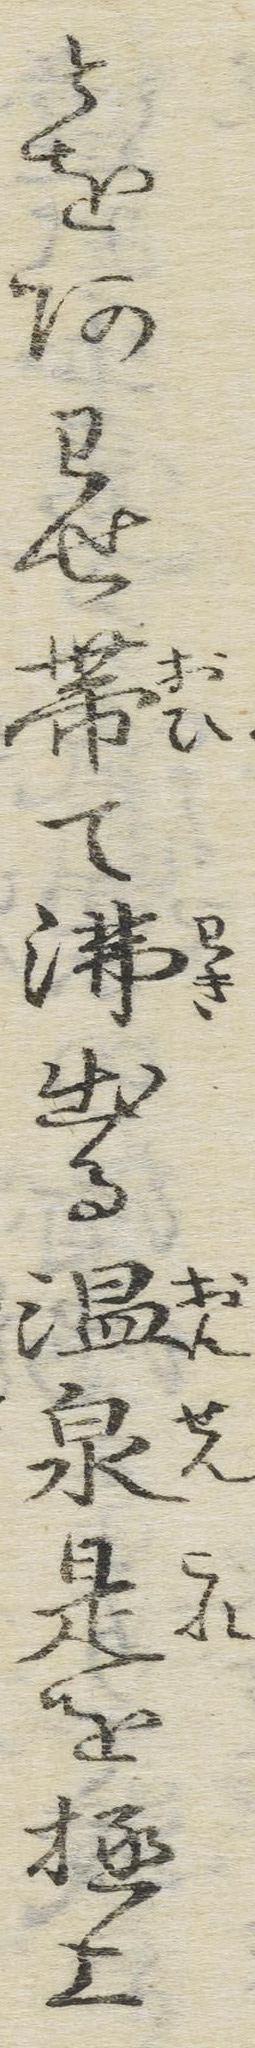とをあわせ帯て沸出る温泉是を極上
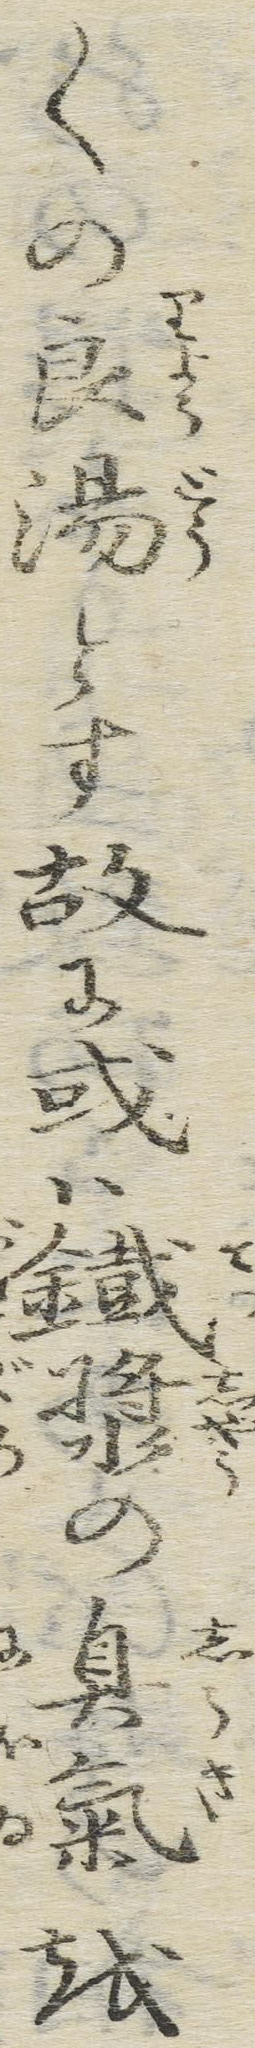〳〵の良湯とす故に或は鉄漿の臭気を
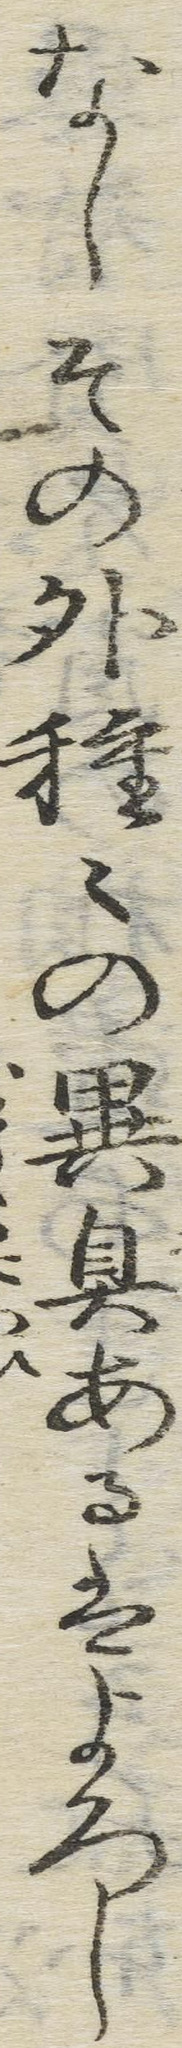なしその外種ゝの異臭あるはよろし
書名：温泉考
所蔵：東京大学地震研究所図書室 Earthquake Research Institute Library, The University of Tokyo, JAPAN
